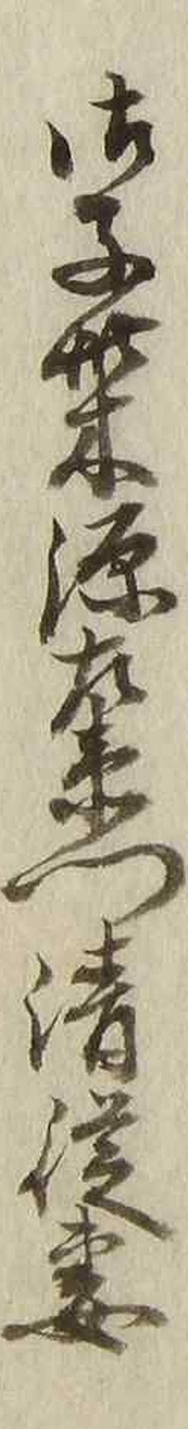女御子柴源左衛門清従妻
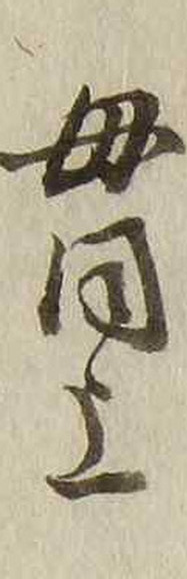母同上

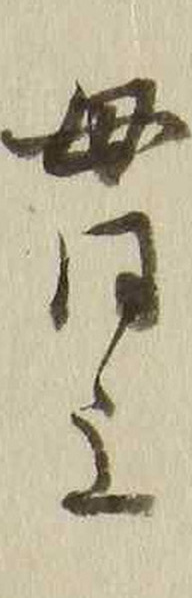母同上
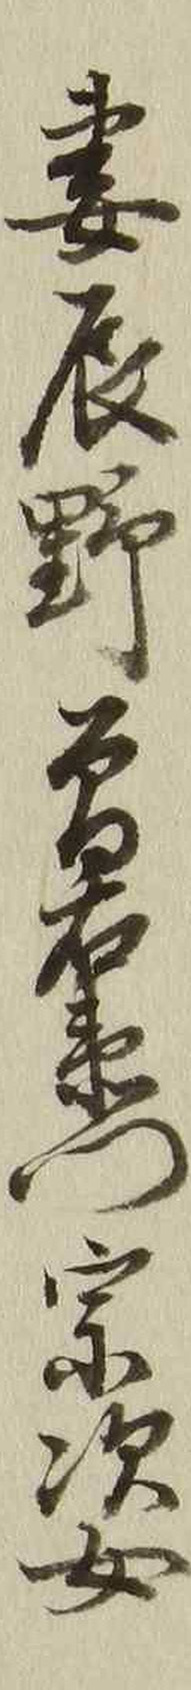妻辰野曾右衛門宗次女
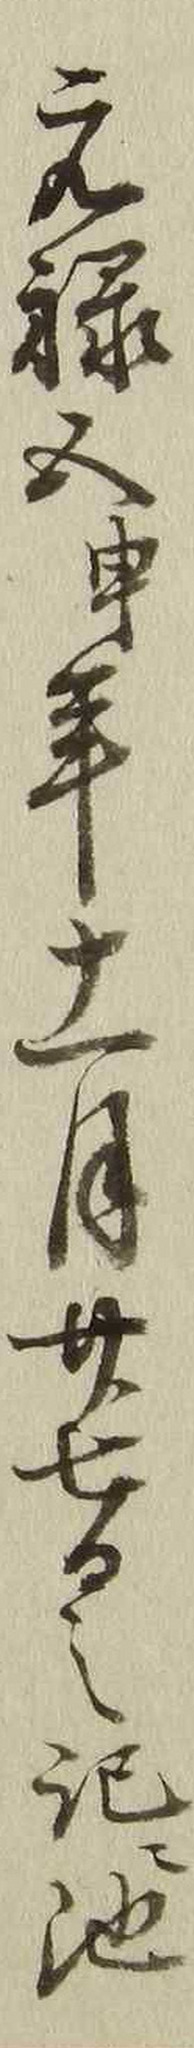元禄五申年十一月廿七日之記ニ池
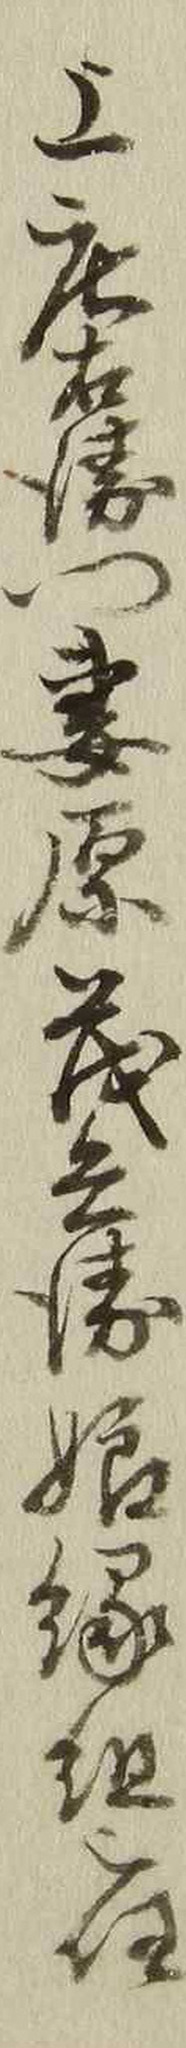上庄右衛門妻原茂兵衛娘縁組被任
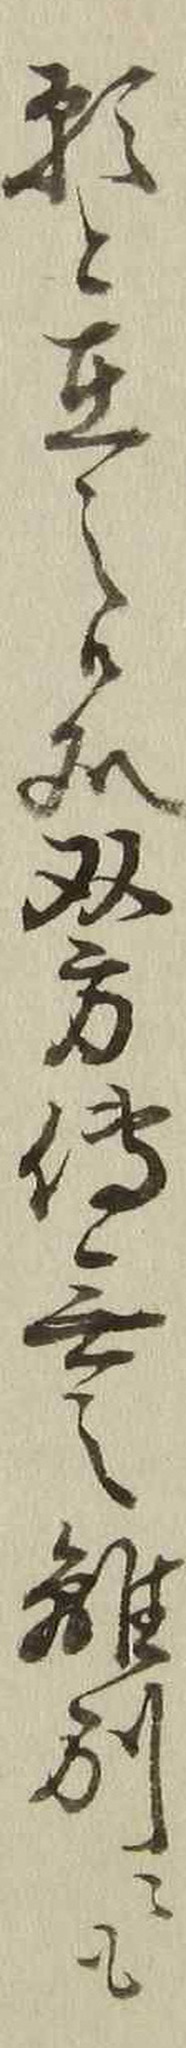願と在之候処双方伝無之離別ニも
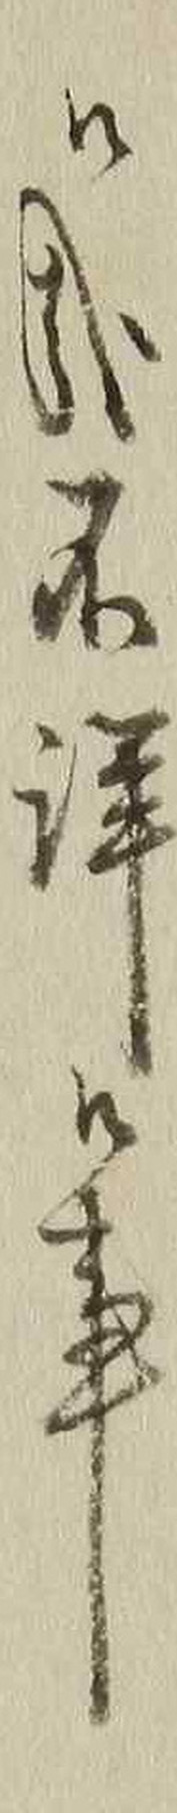候哉不詳候事
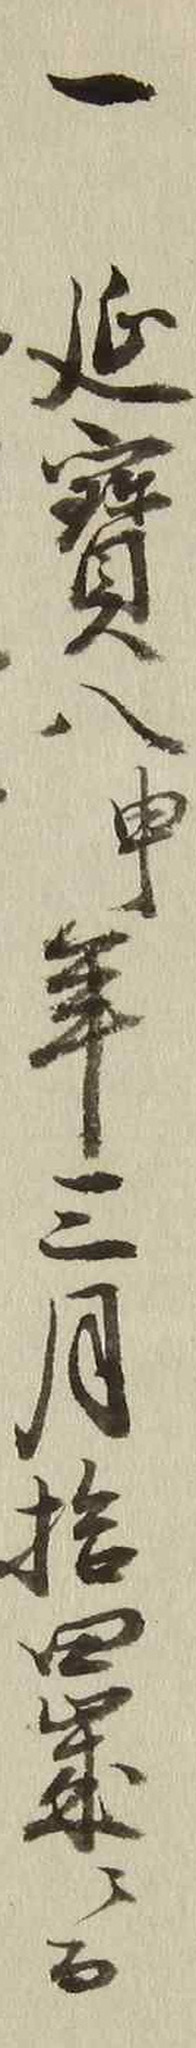一延宝八申年三月拾四歳ニ而
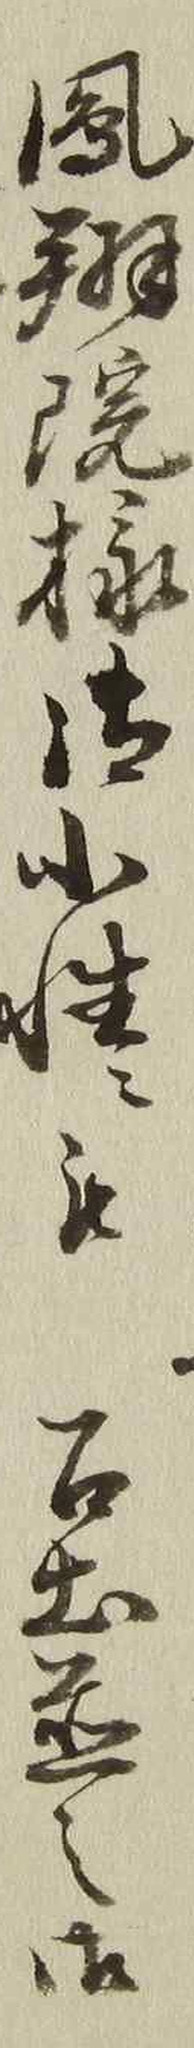鳳翔院様御小姓ニ被召出並之御
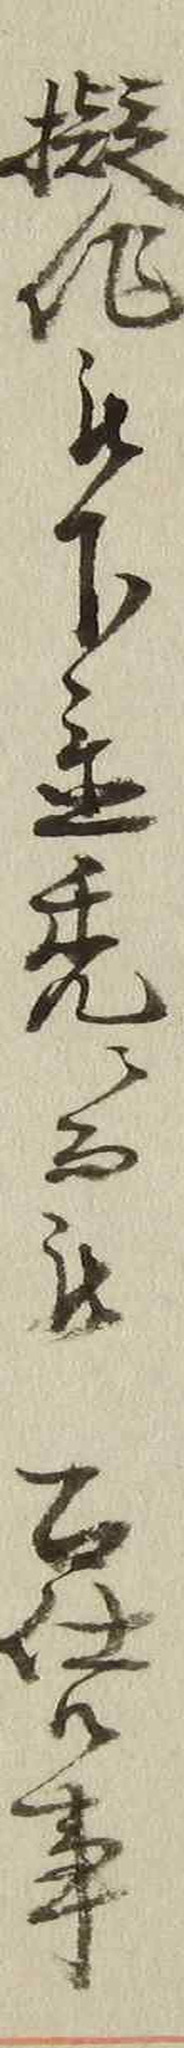擬作被下置禿ニ而被召仕候事
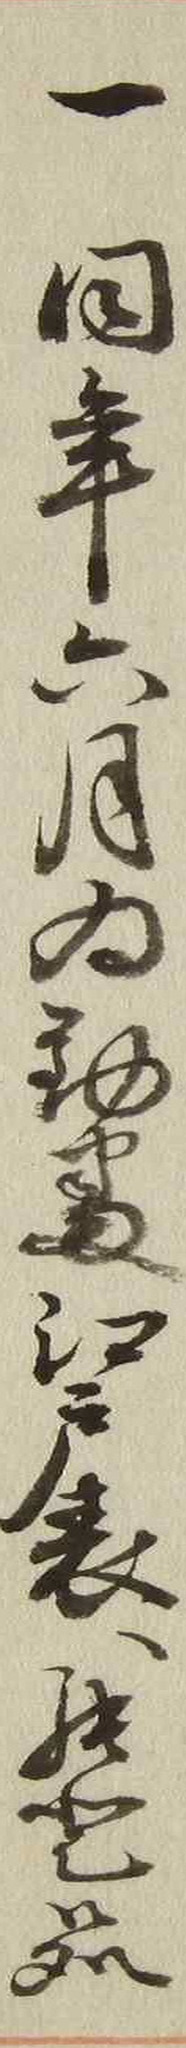一同年六月為勤番江戸表へ罷登候処
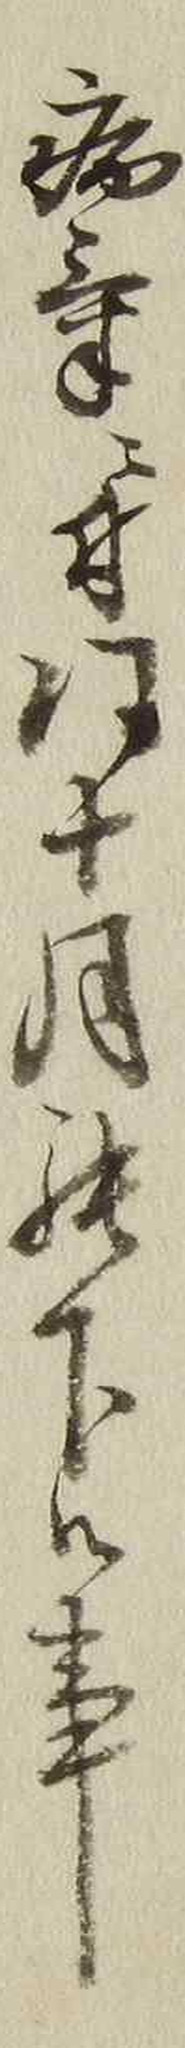病気ニ付同十月罷下候事
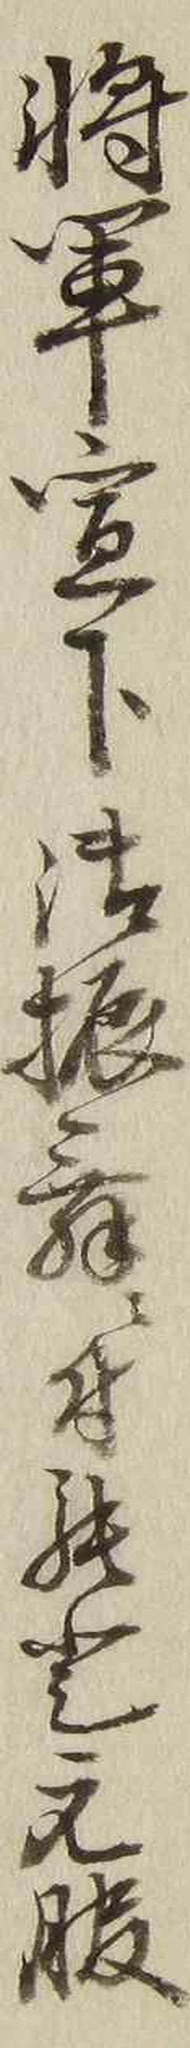将軍宣下御振舞ニ付罷登元服
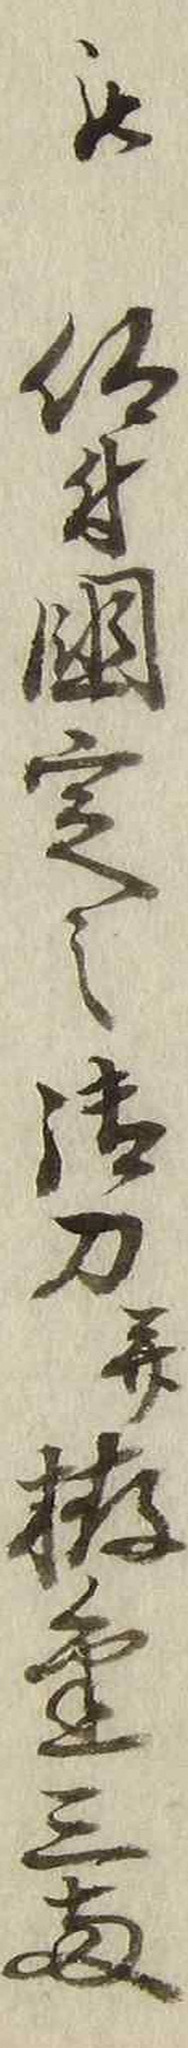被仰付国定之御刀并拵金三両
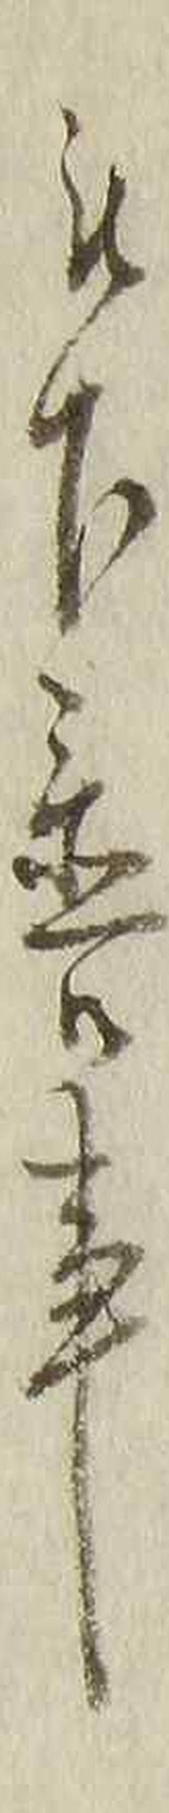被下置候事
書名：諸士系譜　巻之31　い之部31
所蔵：会津若松市立会津図書館
